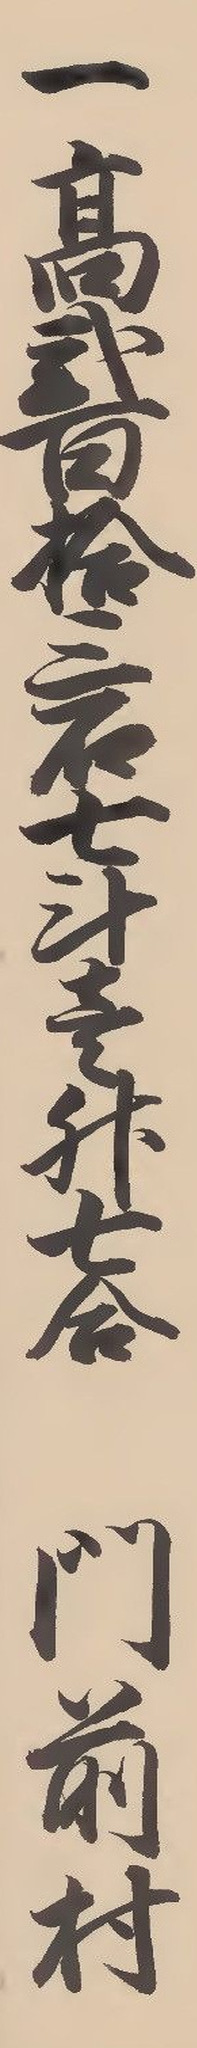一高弐百拾三石七斗壱升七合門前村
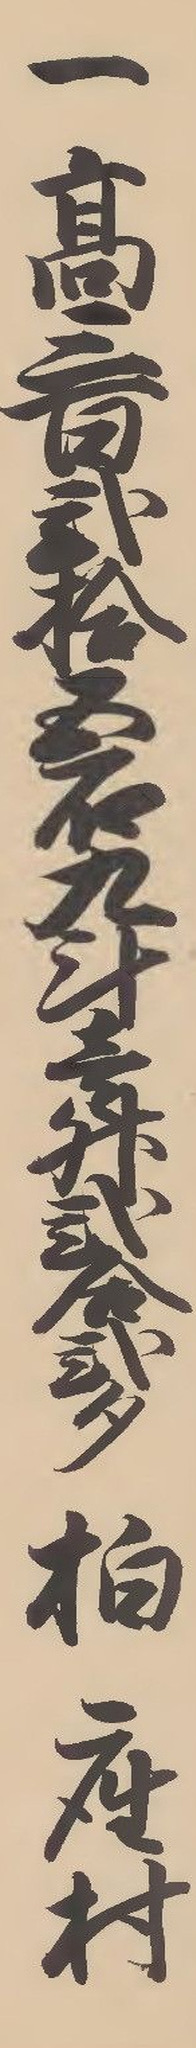一高三百弐拾五石九斗壱升弐合弐勺柏座村
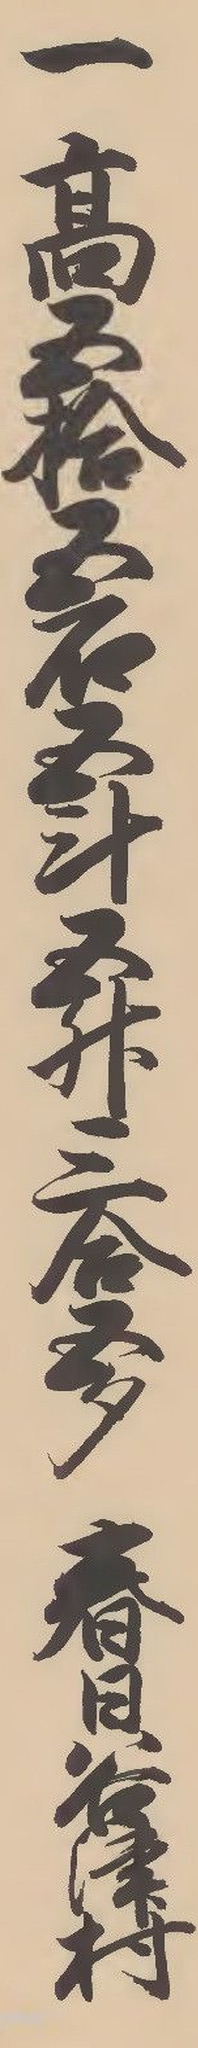一高五拾五石五斗五升三合五勺春日谷津村
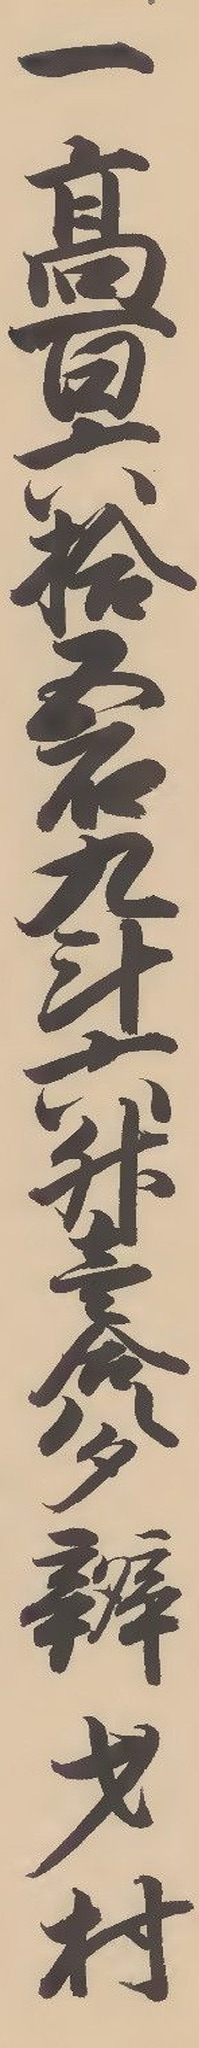一高百六拾五石九斗六升壱合八勺弁才村
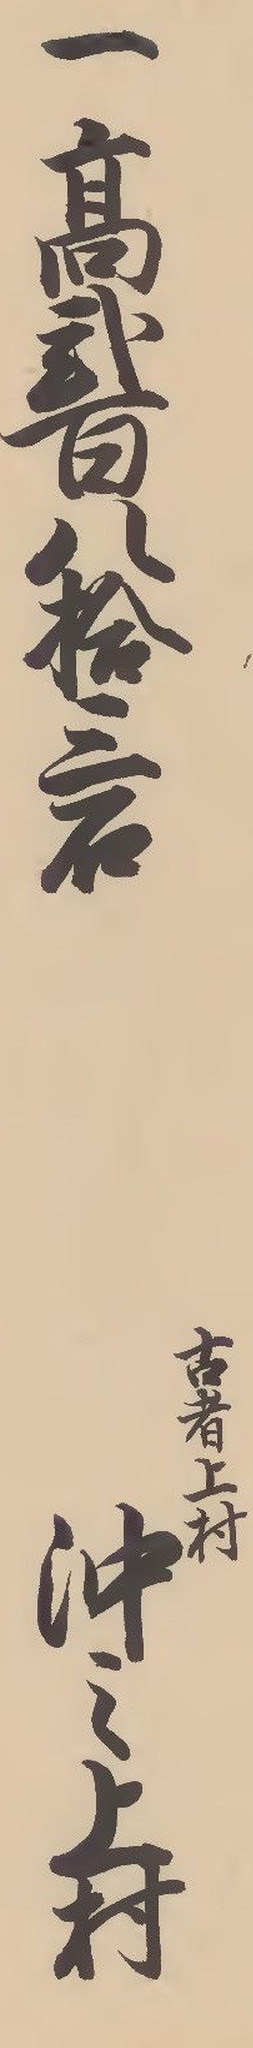一高弐百八拾三石沖之上村

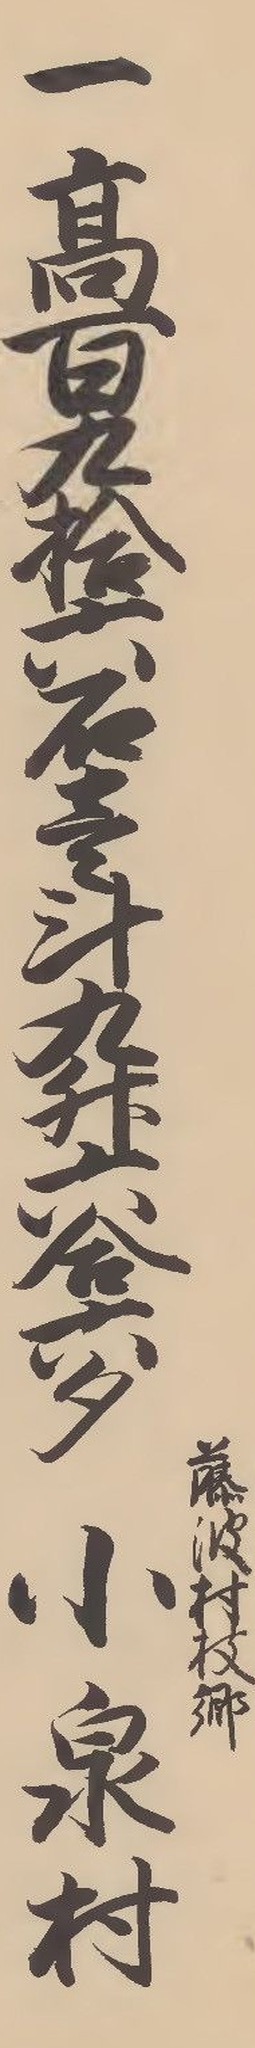一高百九拾六石壱斗九升六合六勺小泉村
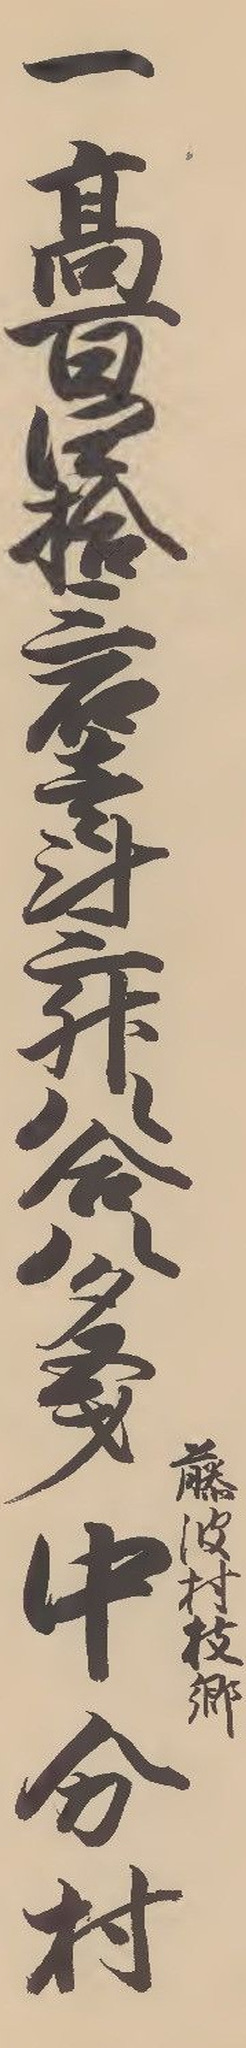一高百四拾三石壱斗三升八合八勺五才中分村
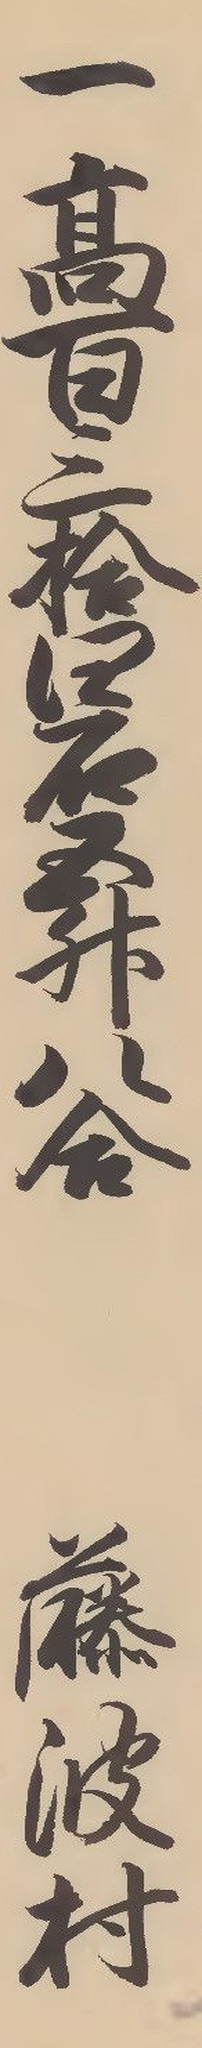一高百三拾四石五升八合藤波村
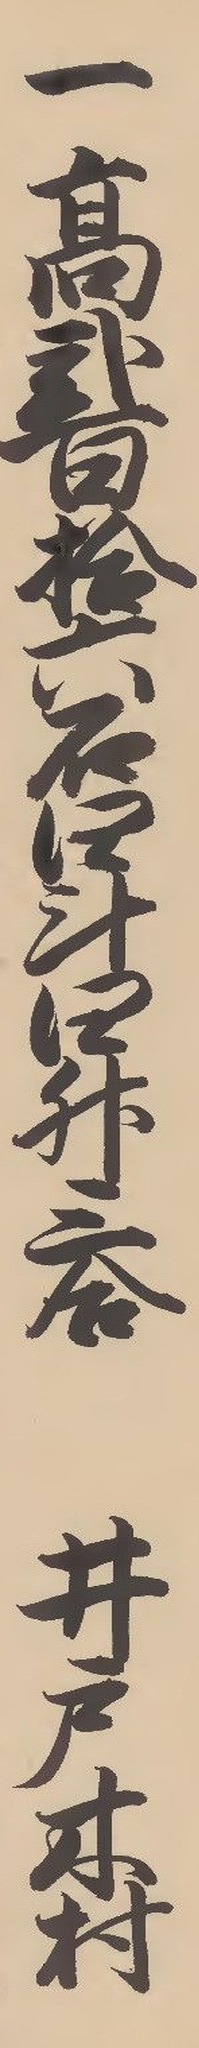一高弐百拾六石四斗四升三合井戸木村
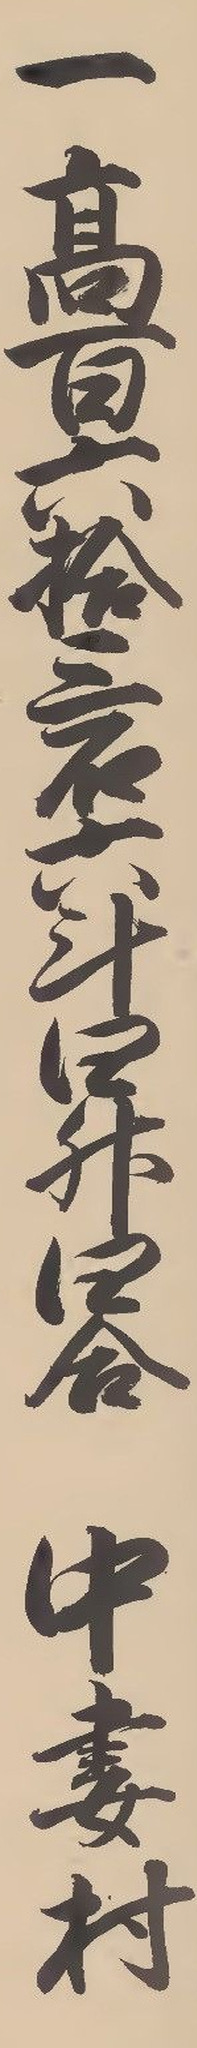一高百六拾三石六斗四升四合中妻村
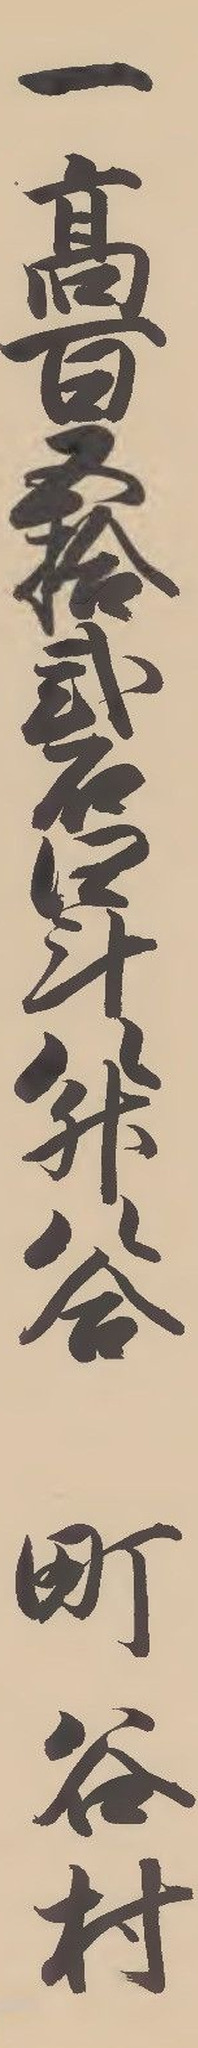一高百五拾弐石四斗八升八合町谷村
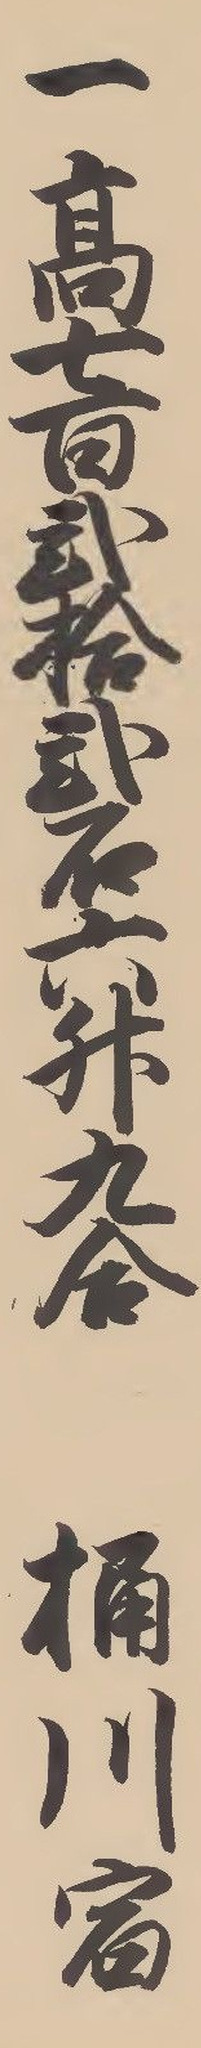一高七百弐拾弐石六升九合桶川宿
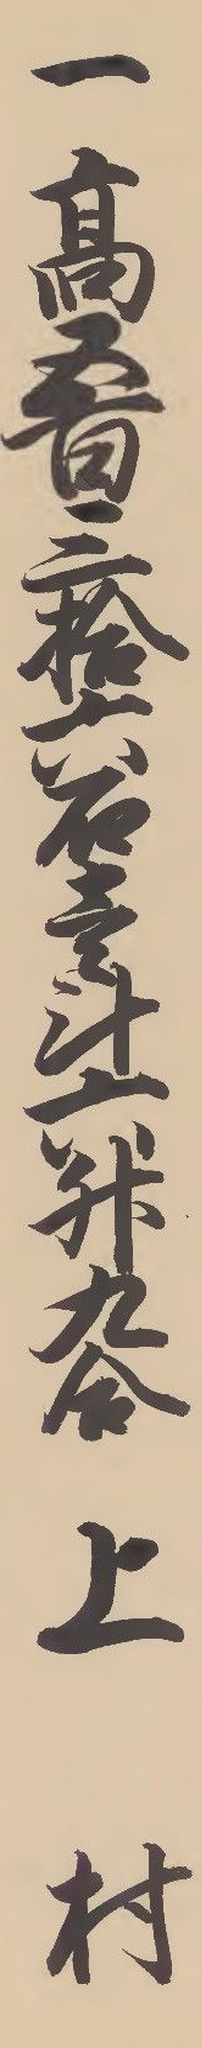一高五百三拾六石壱斗六升九合上村

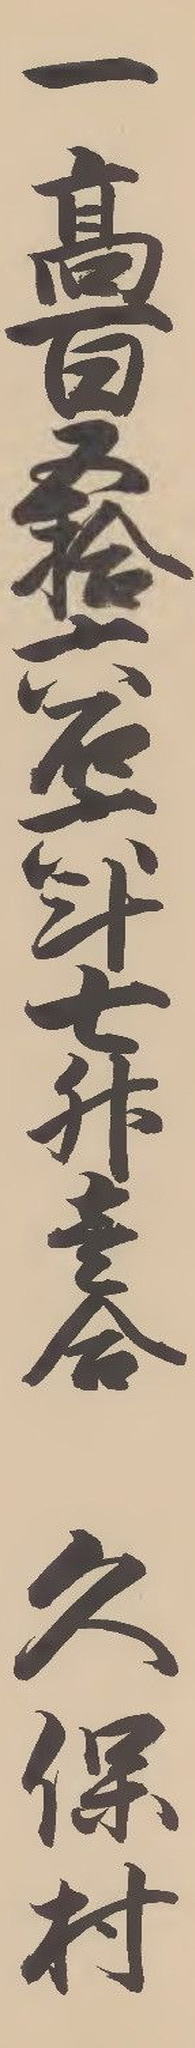一高百五拾六石六斗七升壱合久保村
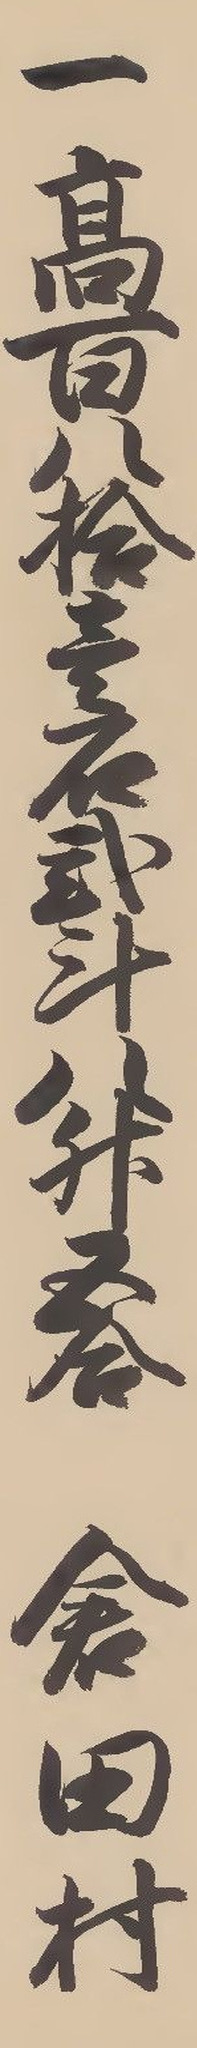一高百八拾壱石弐斗八升五合倉田村
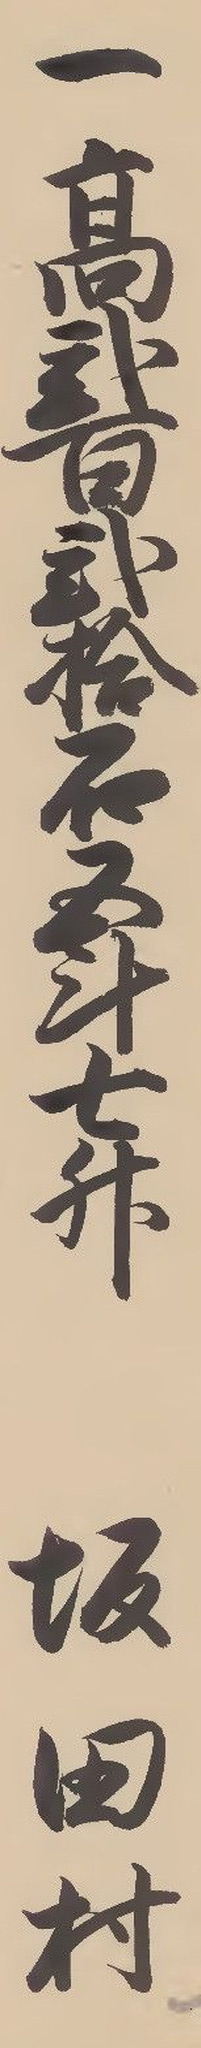一高弐百弐拾石五斗七升坂田村
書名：武蔵国郷帳　下
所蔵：国立公文書館 National Archives of Japan
